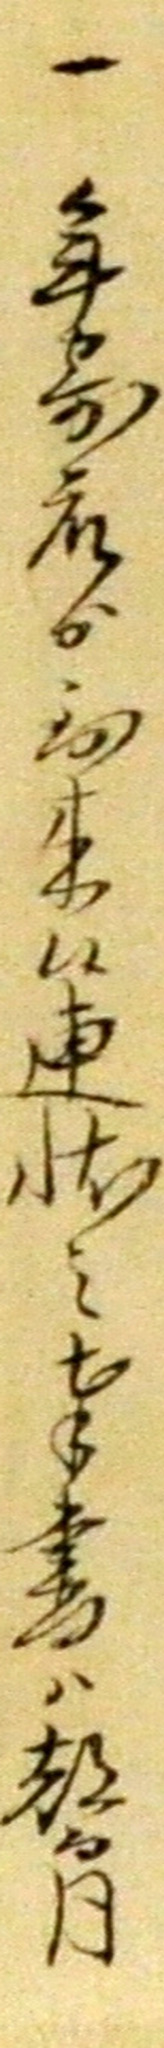一年寄衆ゟ到来候連状之奉書は都而月
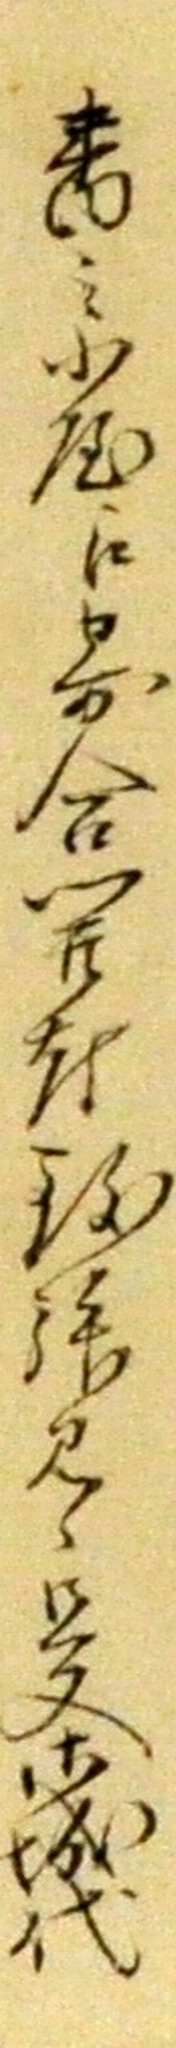番之小屋え寄合開封致拝見候事御城代
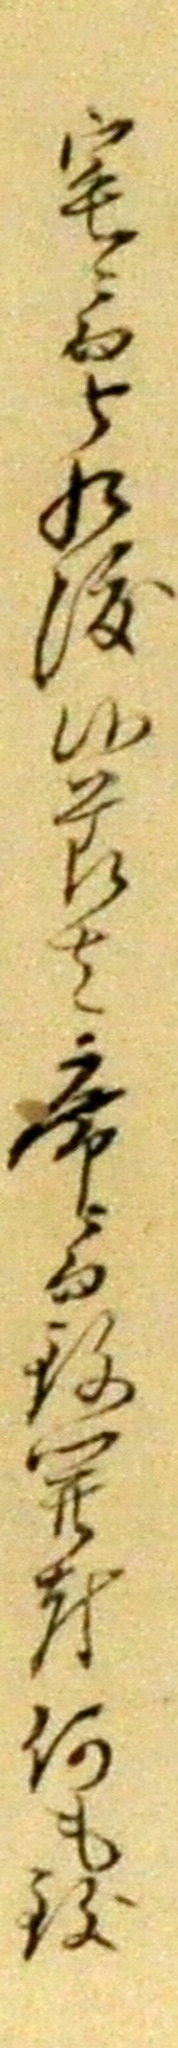宅に而被相渡候節は席に而致開封何も致
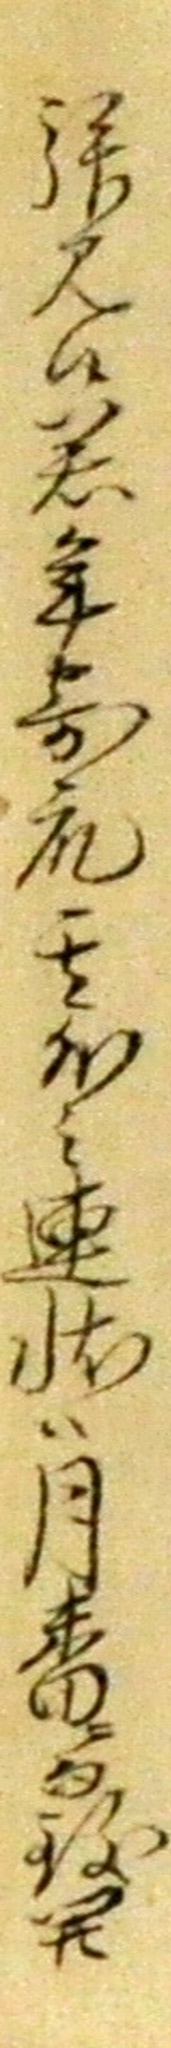拝見候若年寄衆其外之連状は月番に而致開
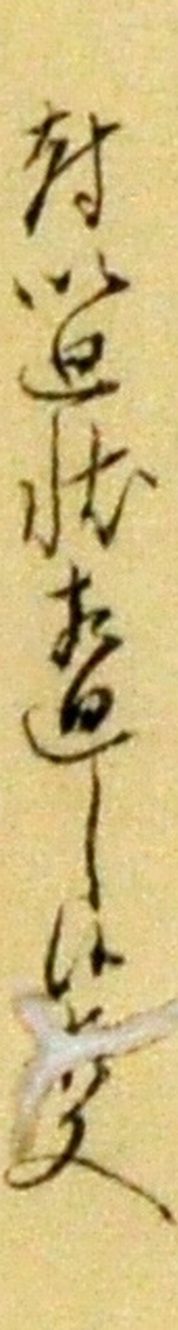封以廻状相廻し候叓
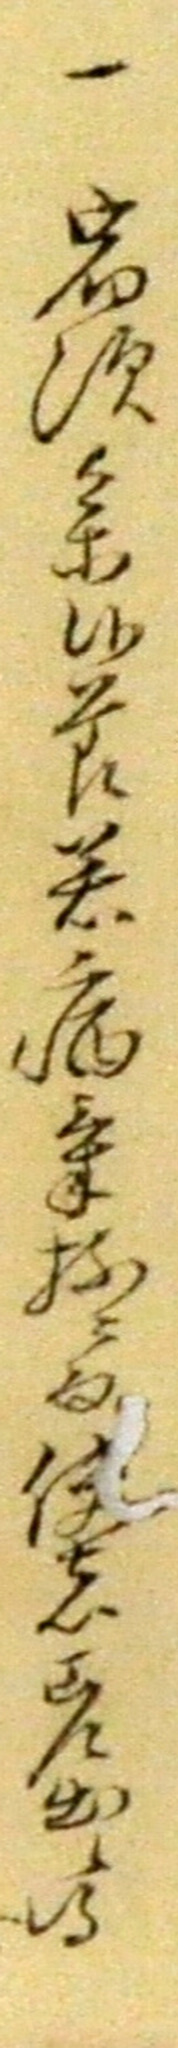一宿次参候節若病気抔に而使者差出候得ば
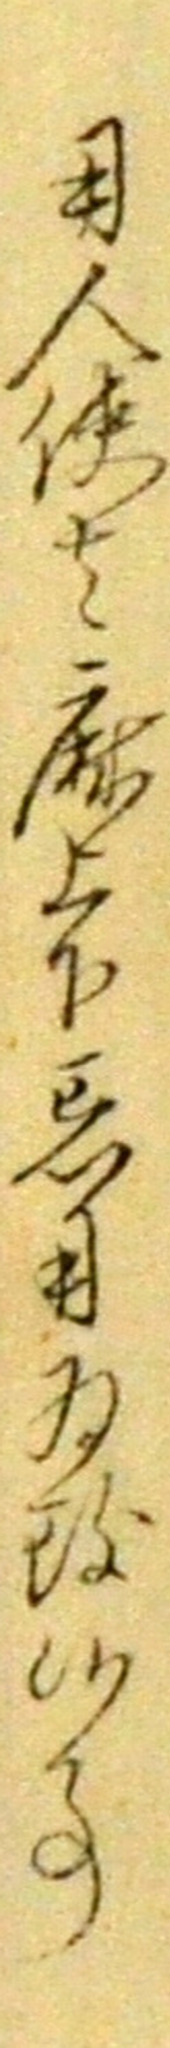用人使者麻上下着用為致候事

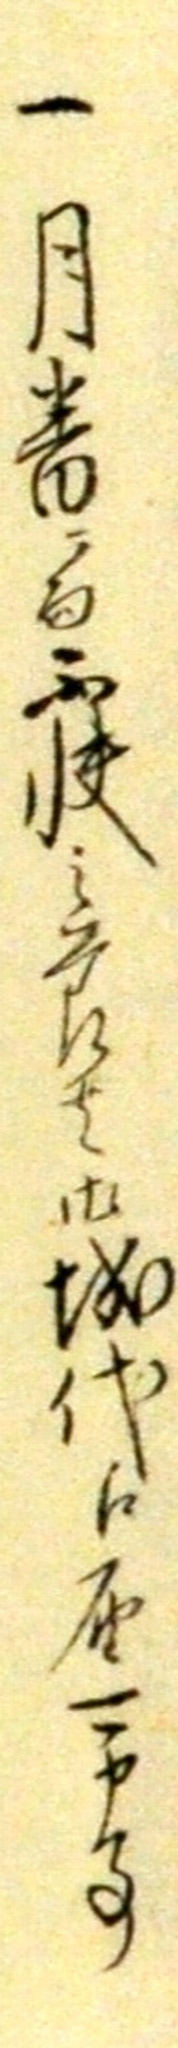一月番に而不快之節は御城代え届可申事
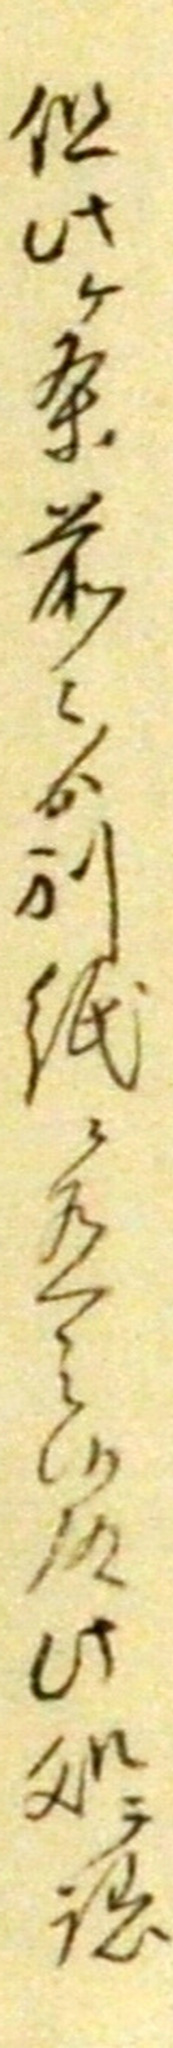但此ヶ条前々ゟ別紙に有之候故此処ヲ認
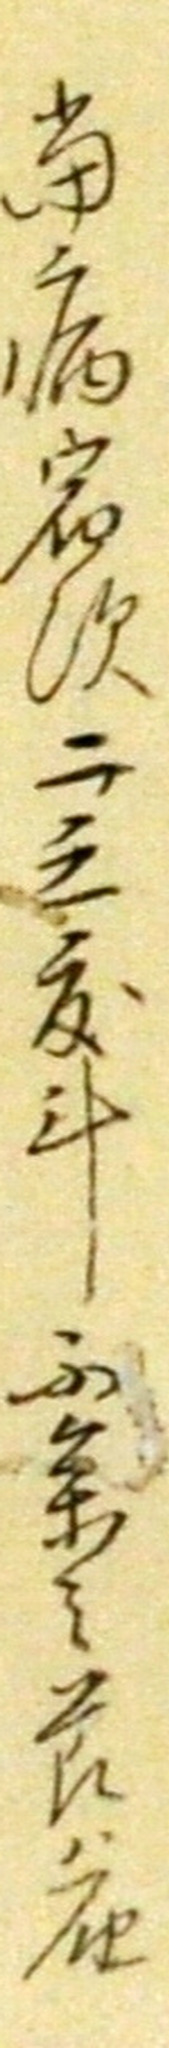当病宿次二三度計不参之節は届
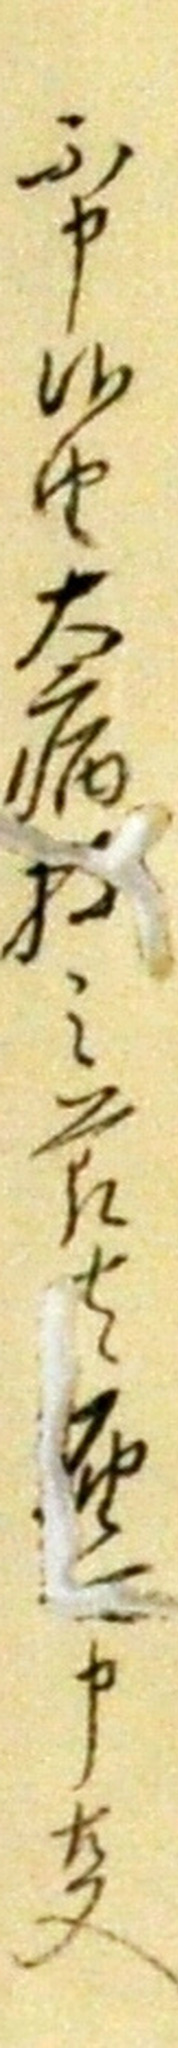不申候由大病抔之節は届可申事
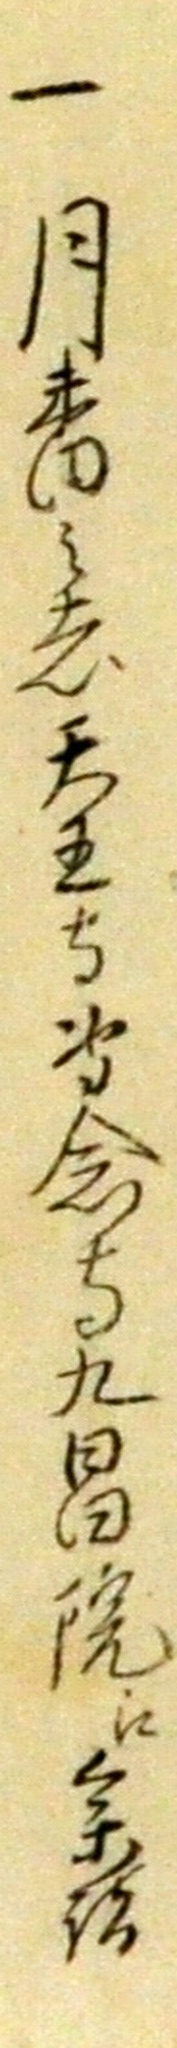一月番之者天王寺専念寺九昌院え参詣
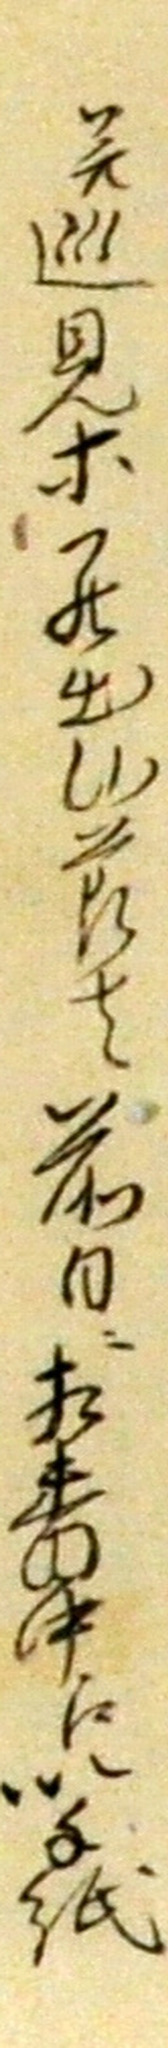并巡見等罷出候節は前日に相番中え以手紙
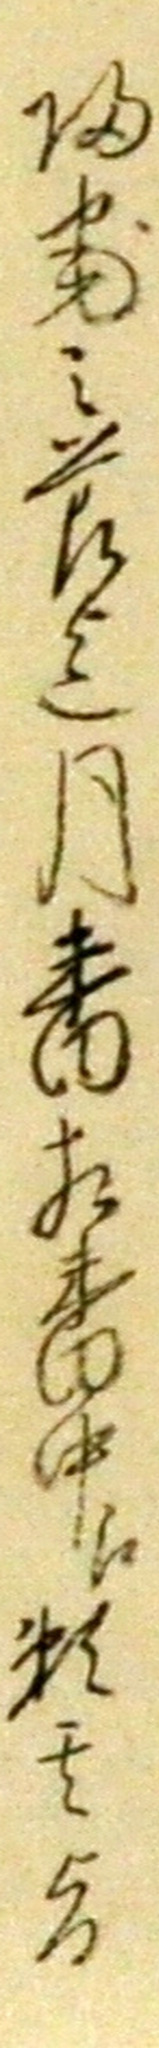帰宅之節迄月番相番中え頼其旨
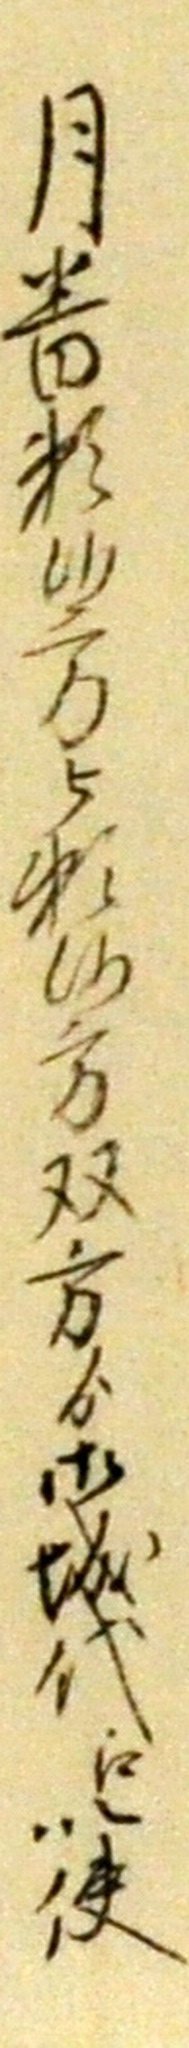月番頼候方被頼候方双方ゟ御城代え以使
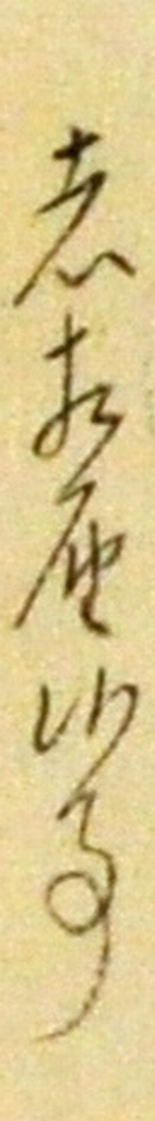者相届候事
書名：大阪加番関係諸書留〔一括〕
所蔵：伊那市立高遠町図書館・合同会社AMANE
